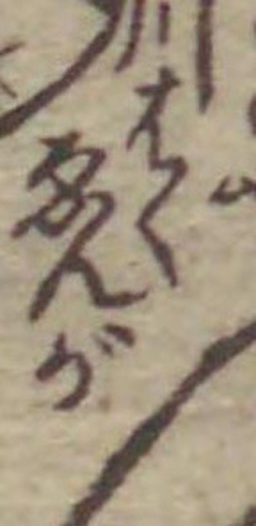ゑんが
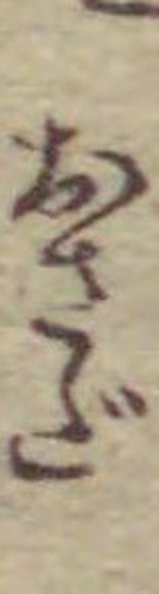おさだ
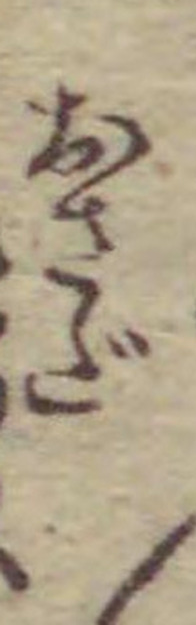おさだ
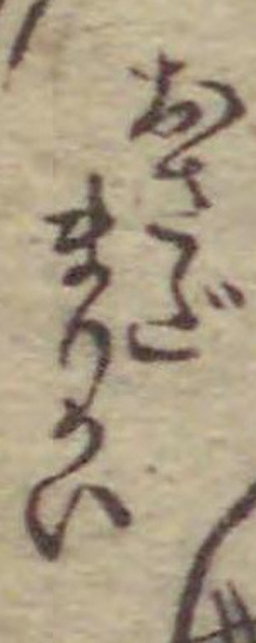まりかい
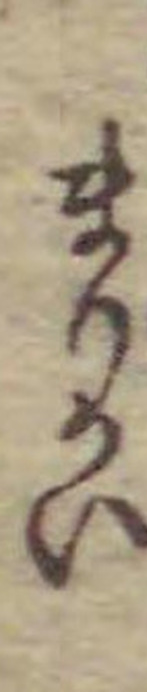まりかい

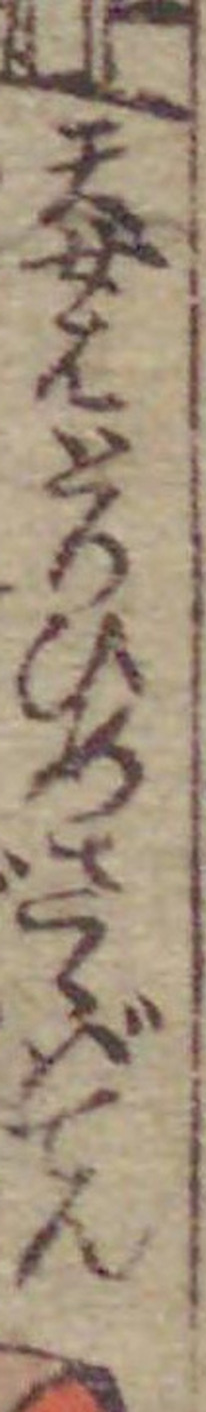天女はとりひめさらばてん
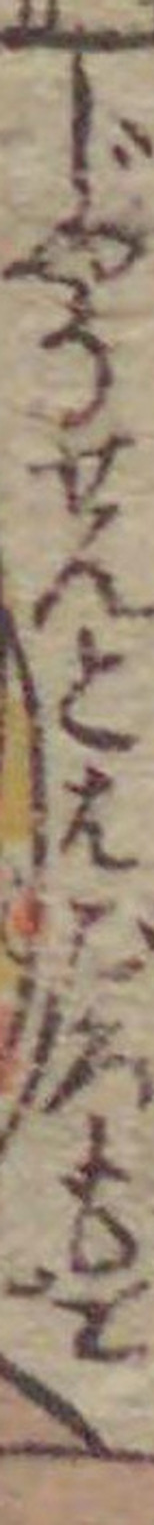じやうせんとはごろもを
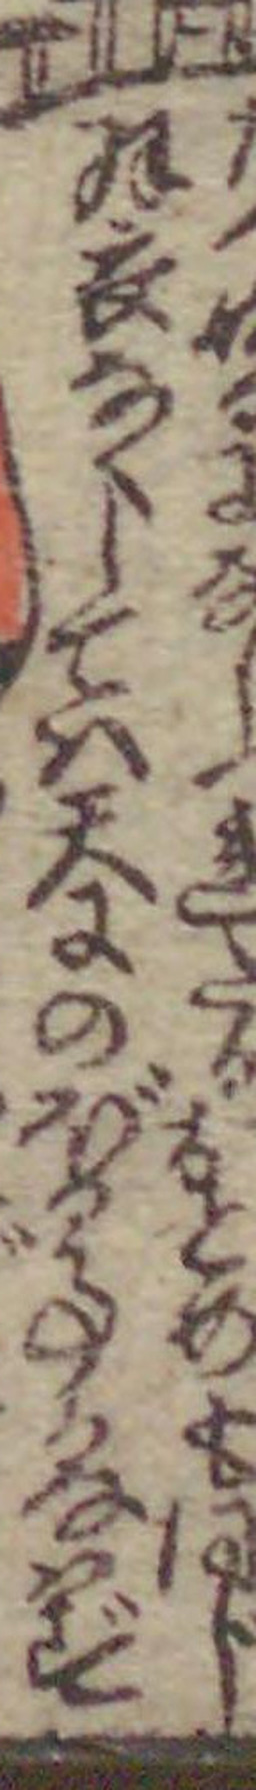羽衣なくしては天にのぼる事かなはず
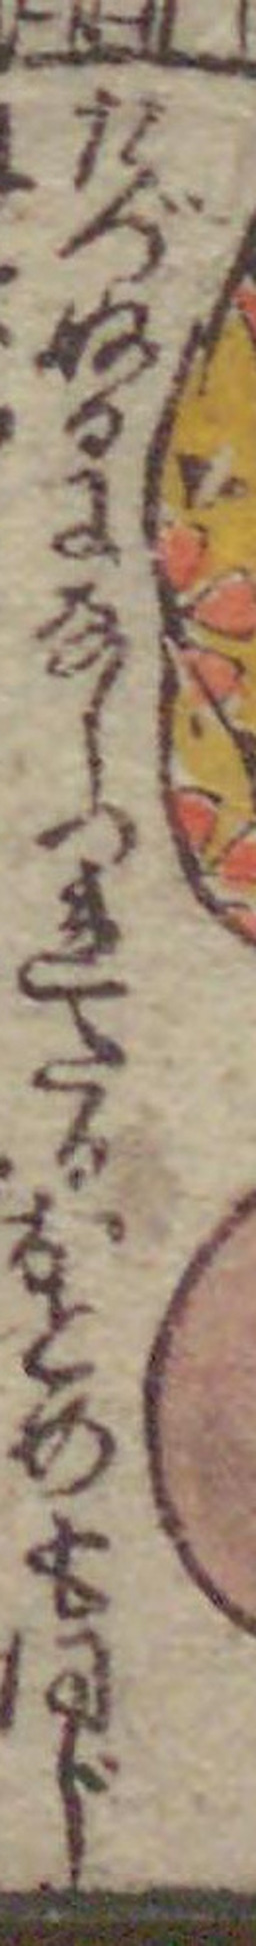たづぬるになしつれたるおとめも同じ
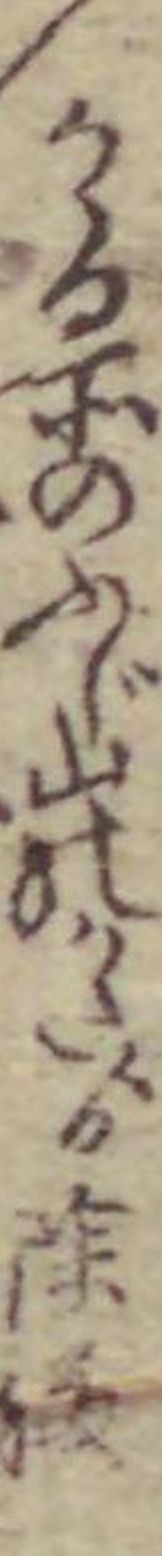かゝる所のふじ山のかたより除複
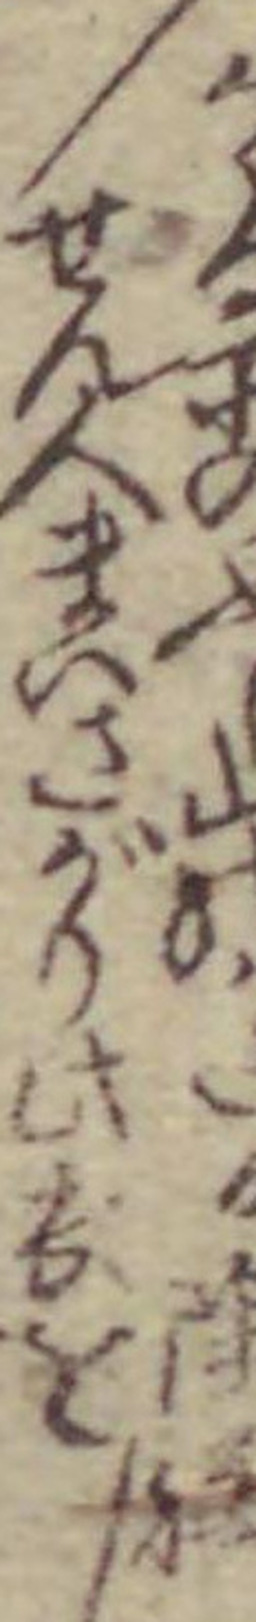せん人まいさがり此衣を
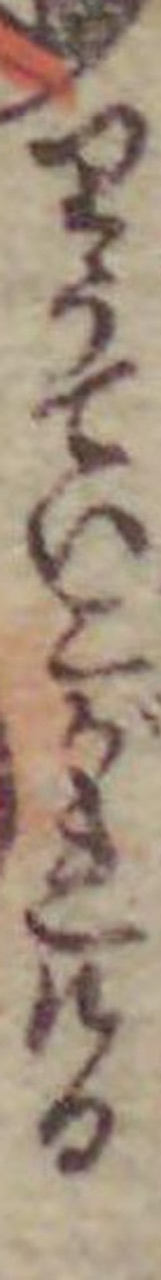りうていこがれける
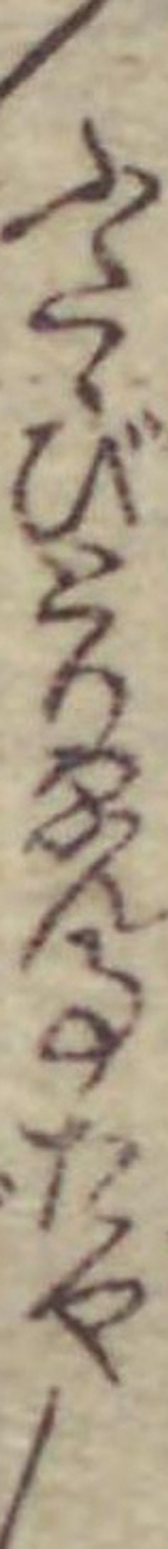ふたゝびとりゑん事たや
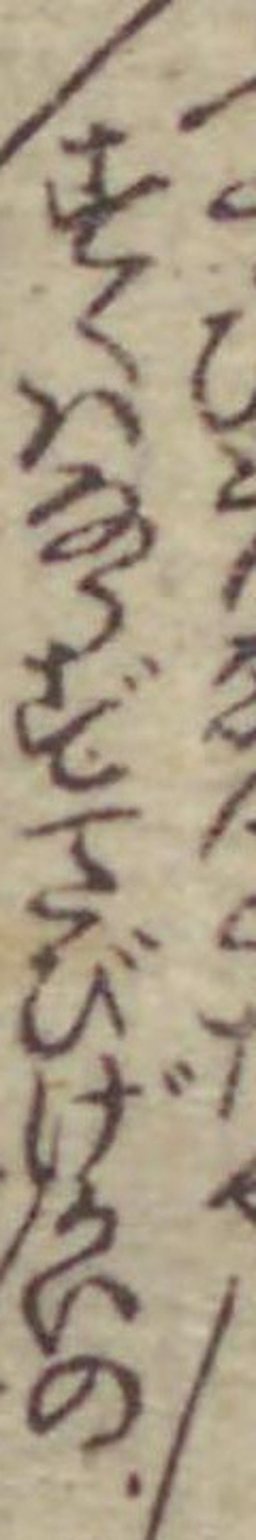すくはならず一たびげかいの
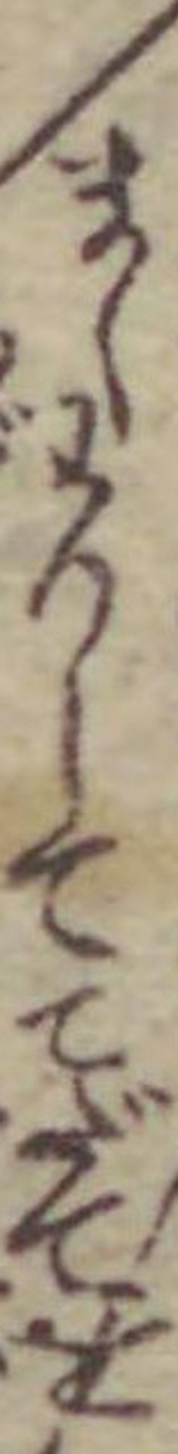ましわりしててだてを
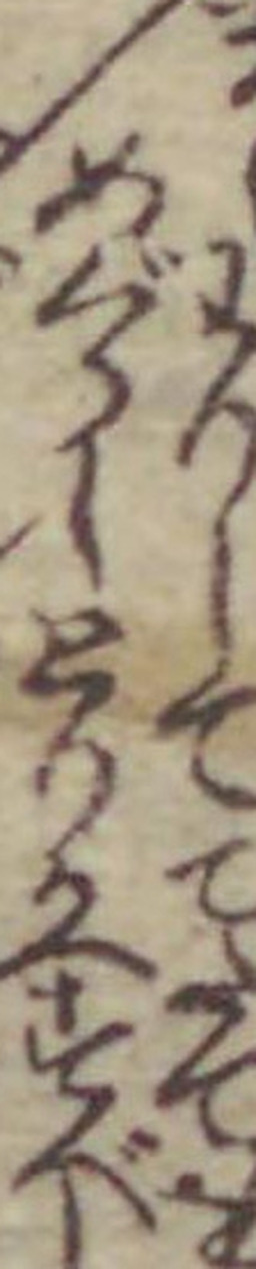めぐらしとりかへすべし
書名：娜二代鉢木 5巻
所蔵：国立国会図書館 National Diet Library, JAPAN
